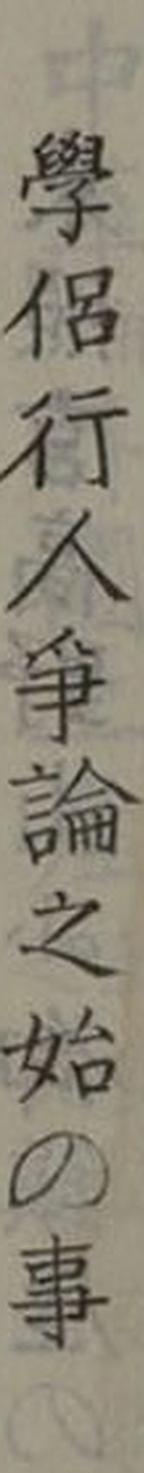學侶行人爭論之始の事
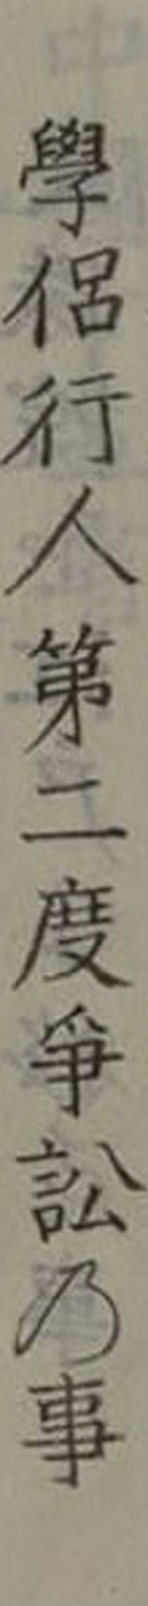學侶行人第二度爭訟の事
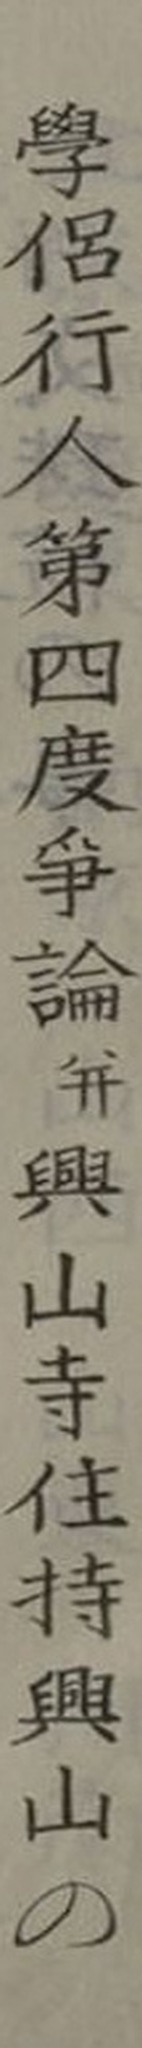學侶行人第四度爭論并興山寺住持興山の
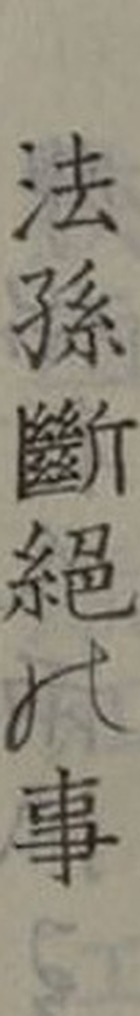法孫斷絶の事
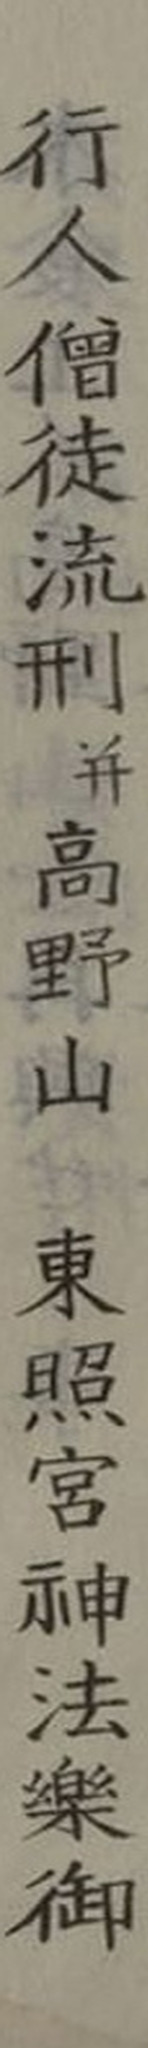行人僧徒流刑并高野山東照宮神法樂御
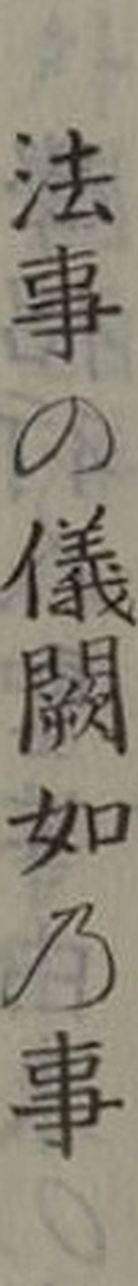法事の儀闕如の事
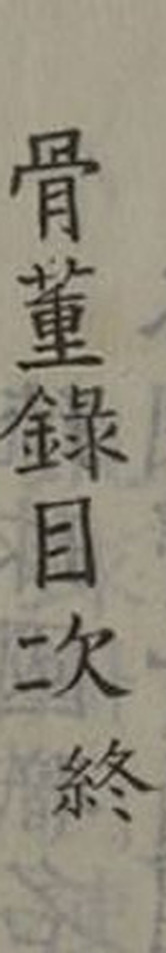骨董錄目次終
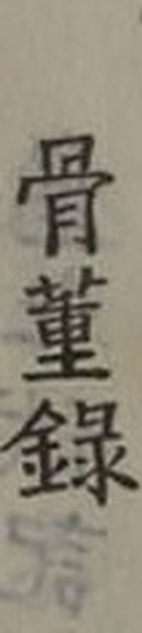骨董錄
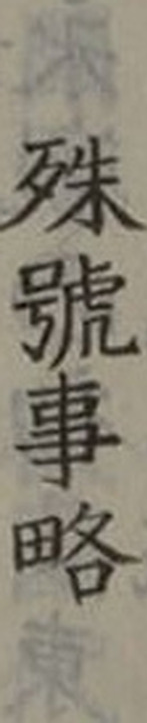殊號事略
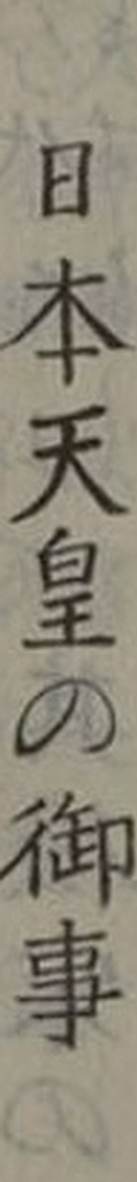日本天皇の御事
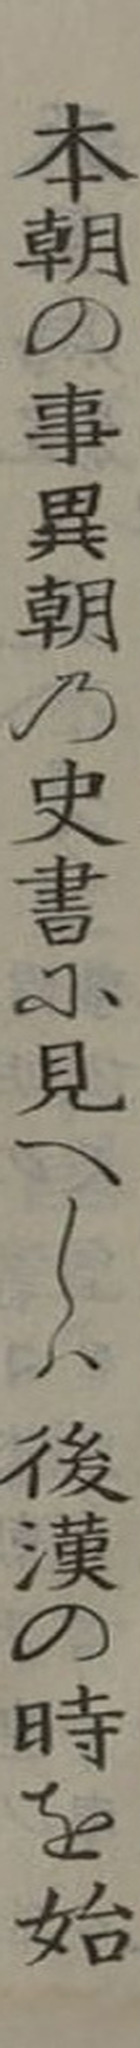本朝の事異朝の史書に見へしハ後漢の時を始
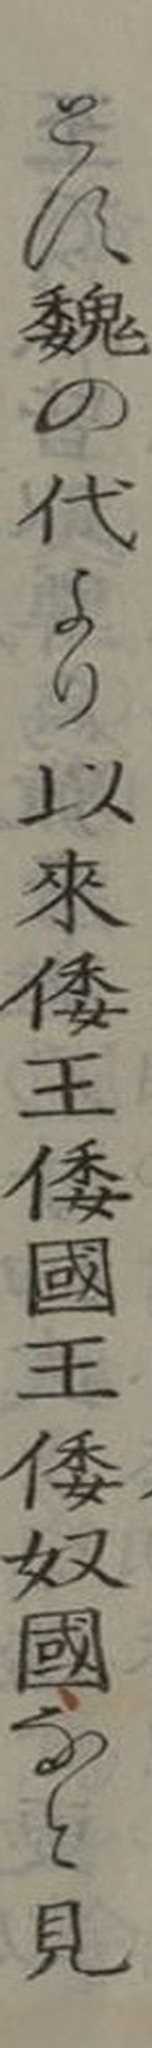とす魏の代より以來倭王倭國王倭奴國なと見
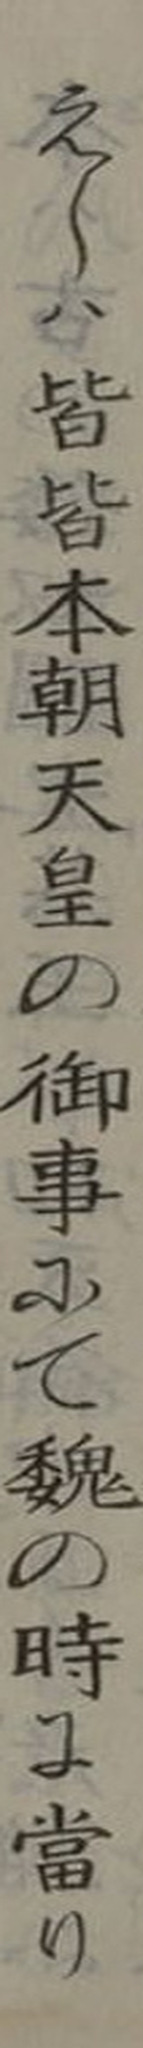えしハ皆皆本朝天皇の御事にて魏の時に當り
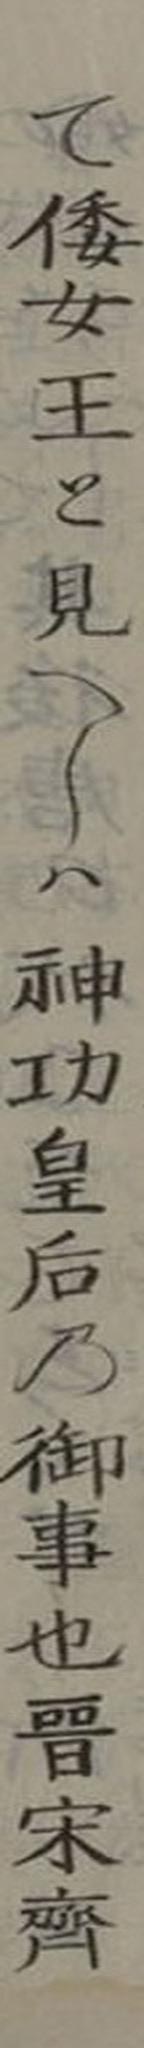て倭女王と見へしは神功皇后の御事也𣈆宋齊
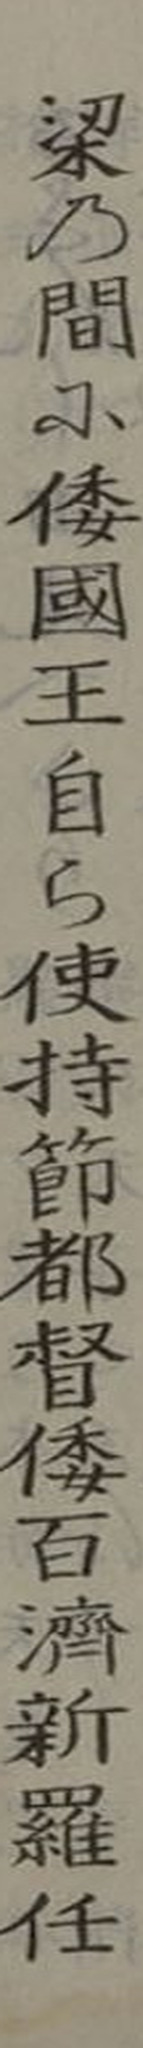梁の間に倭國王自ら使持節都督倭百濟新羅任
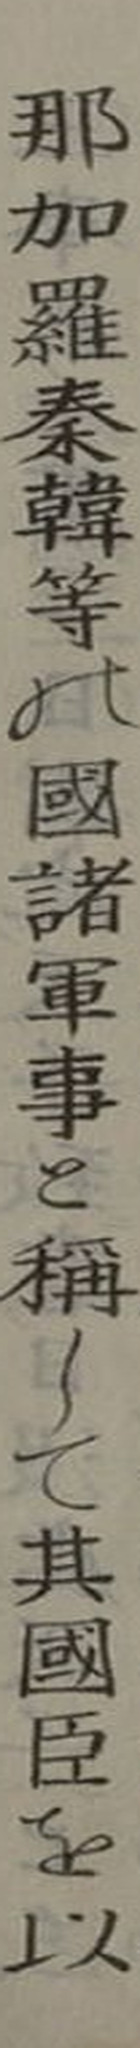那加羅秦韓等の國諸軍事と稱して其國臣を以
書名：骨董録
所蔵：University of the Ryukyus Library
